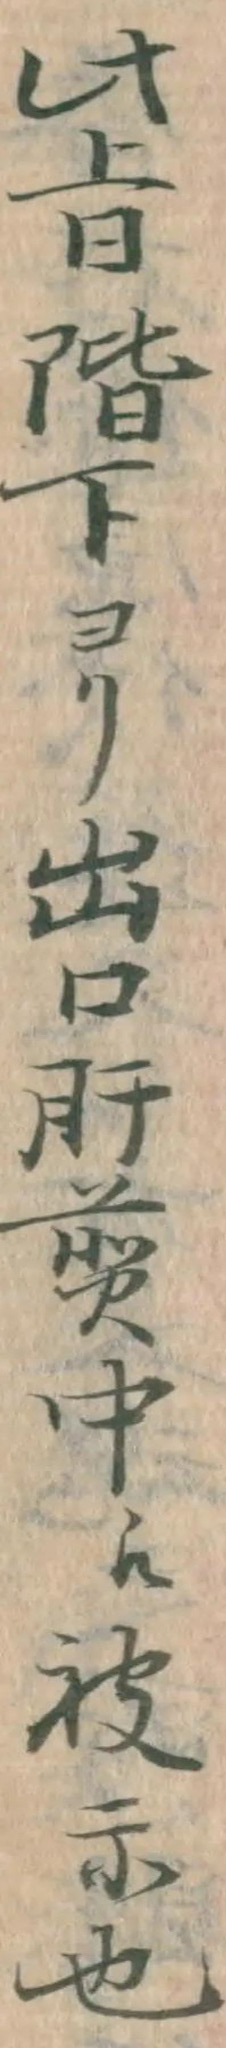此旨階下ヨリ出口肝煎中江被示也
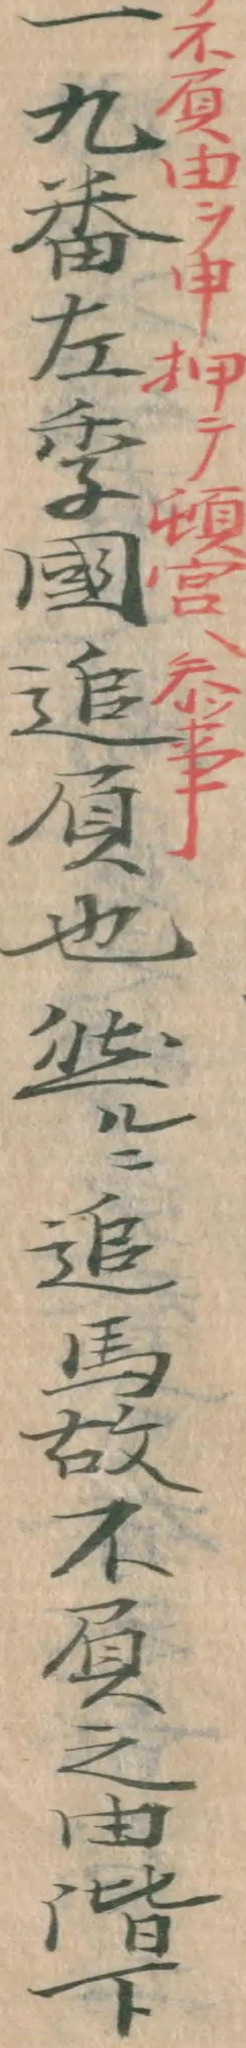一九番左季国追負也然ルニ追馬故不負之由階下
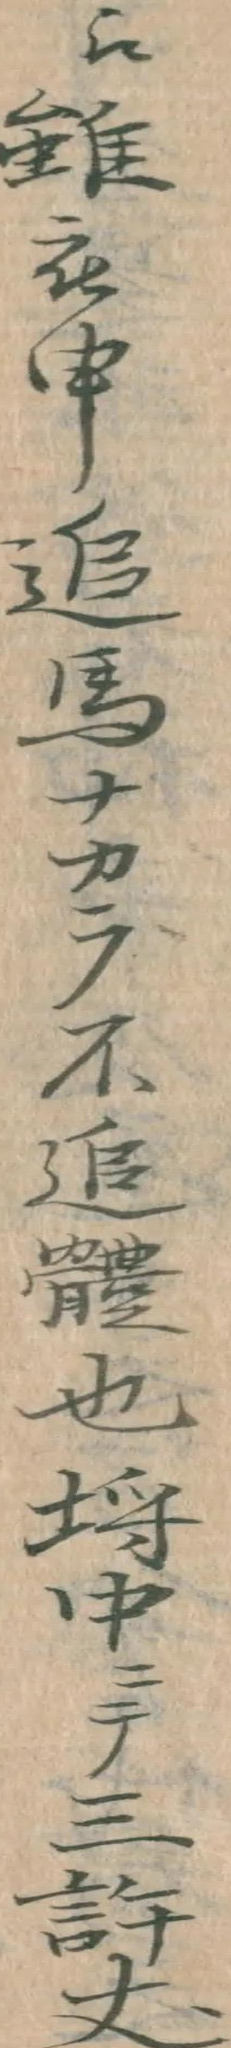江雖被申追馬ナカラ不追体也埒中ニテ三許丈
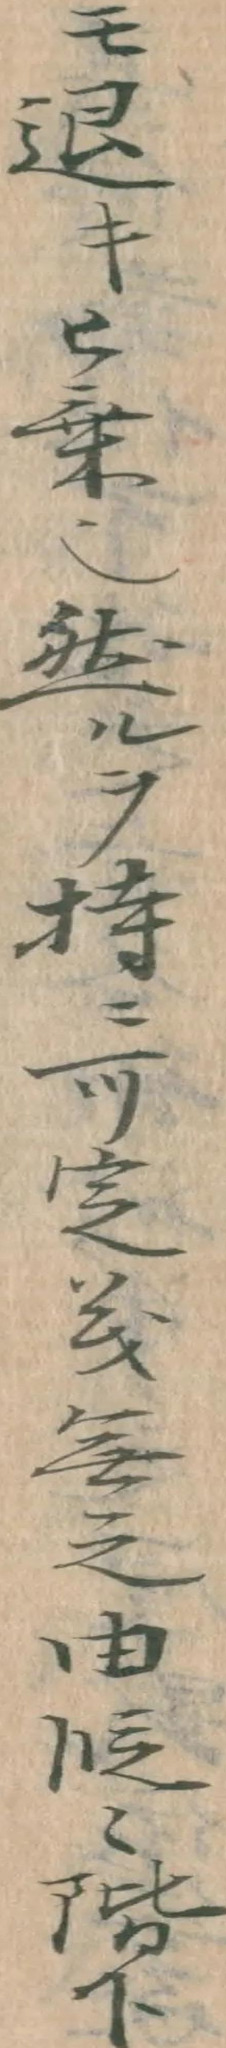モ退キ被乗也然ルヲ持ニ可定義無之由段々階下
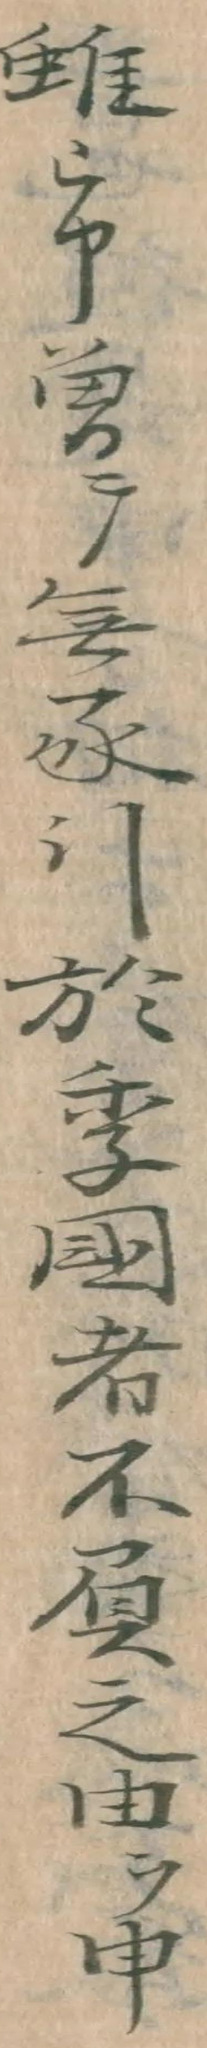雖被申曽テ無承引於季国者不負之由ヲ申
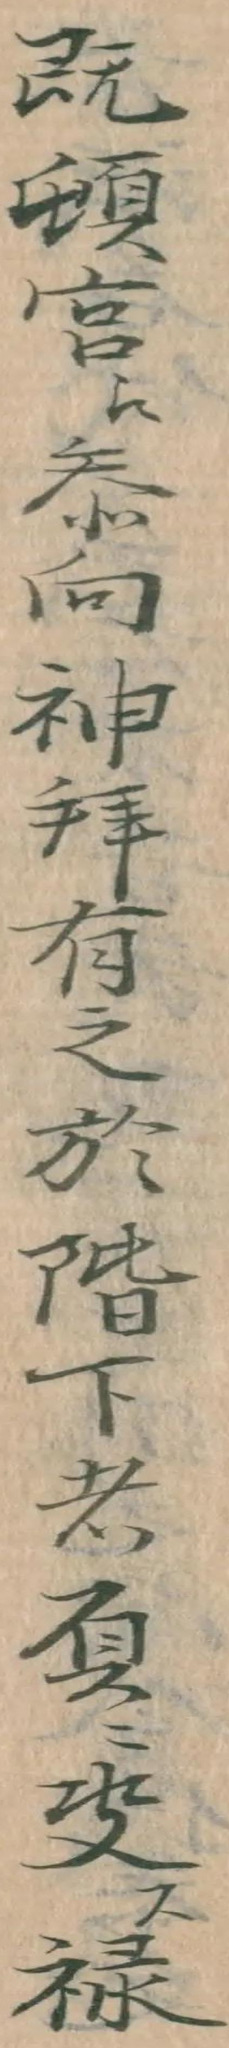既頓宮江参向神拝有之於階下者負ニ決ス禄
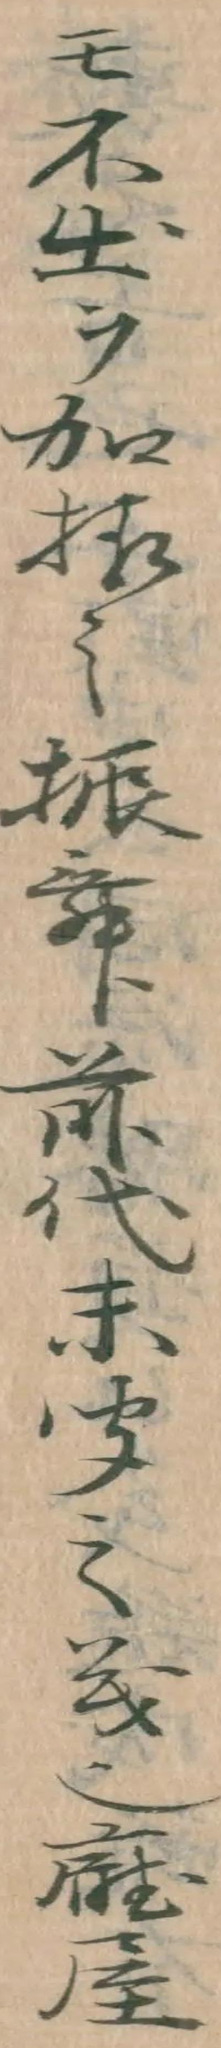モ不出ヲ加様之振舞前代未聞之義也庁屋
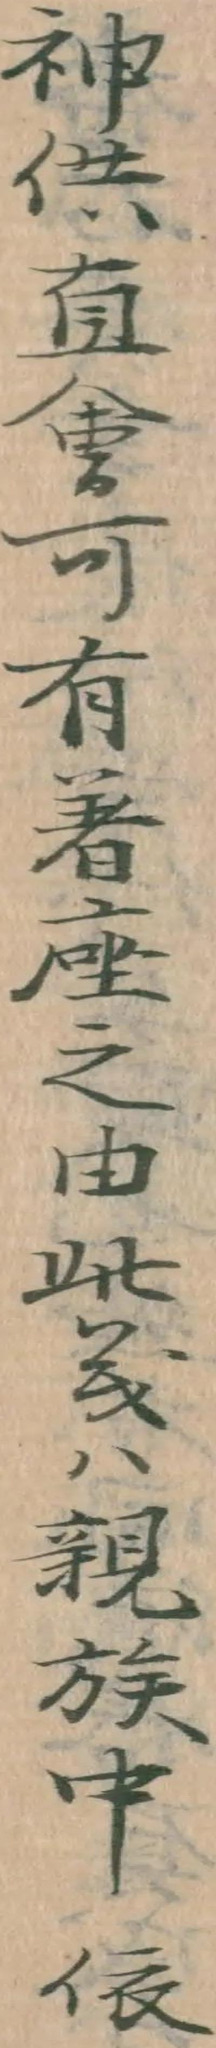神供直会可有着座之由此義ハ親族中依
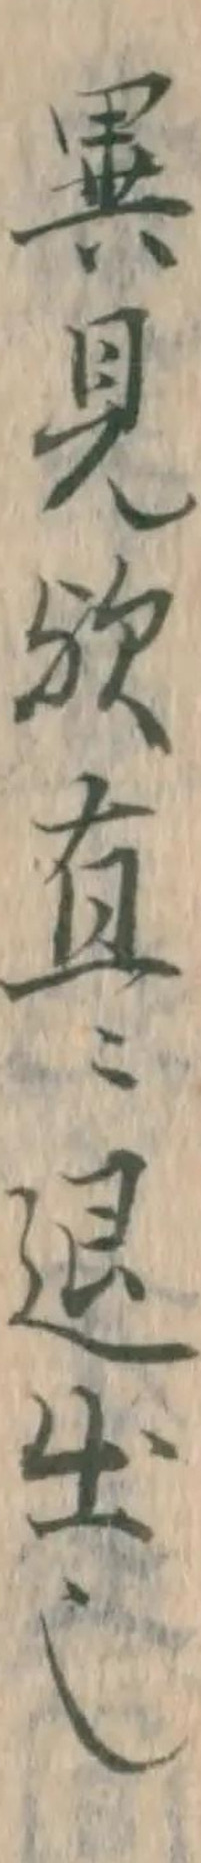異見歟直ニ退出也
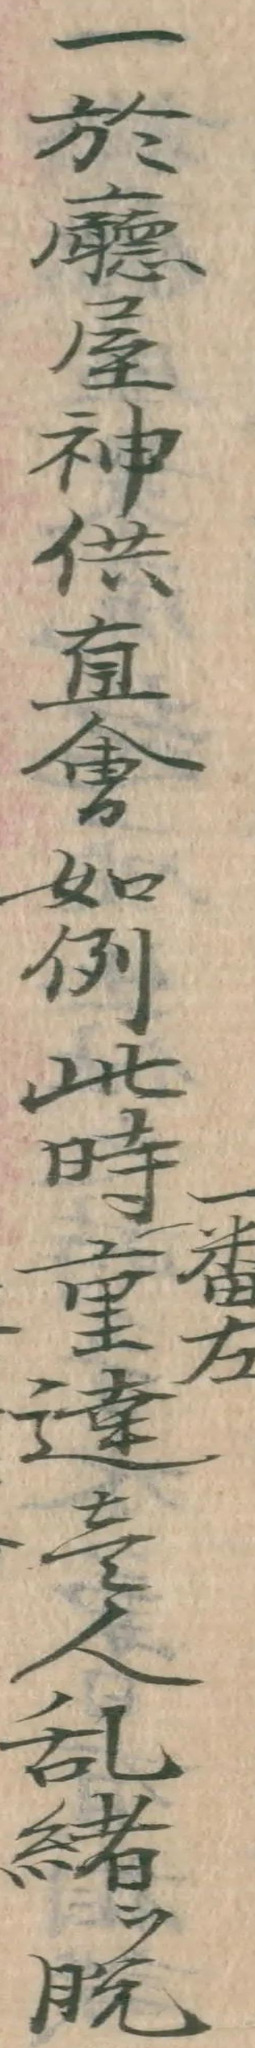一於庁屋神供直会如例此時重達壱人乱緒ヲ脱
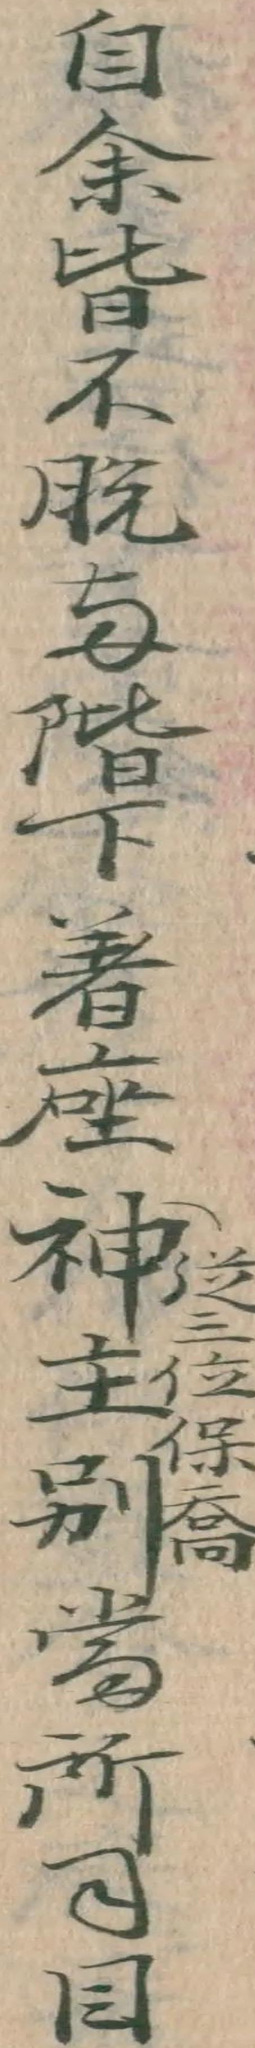自余皆不脱両階下着座神主別当当所司目
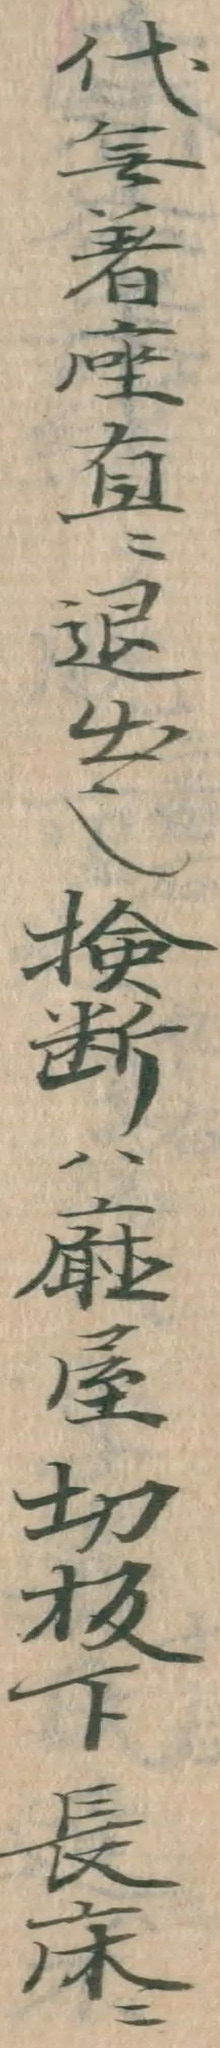代無着座直ニ退出也検断ハ庁屋切板下長床ニ
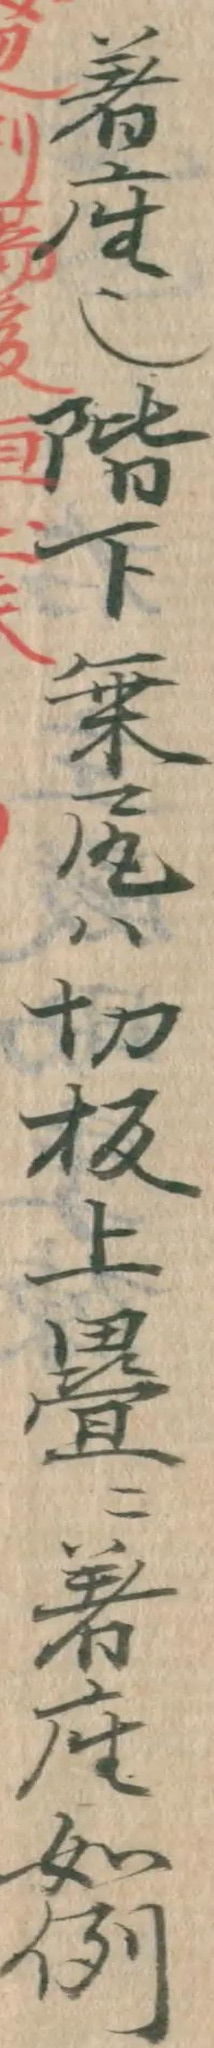着座也階下乗尻ハ切板上畳ニ着座如例
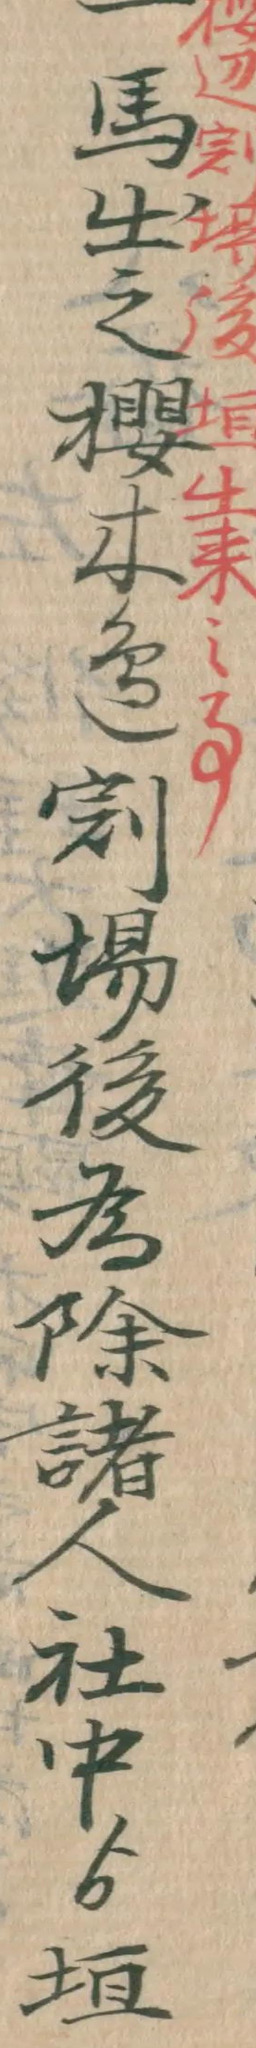一馬出之桜木辺割場後為除諸人社中ゟ垣
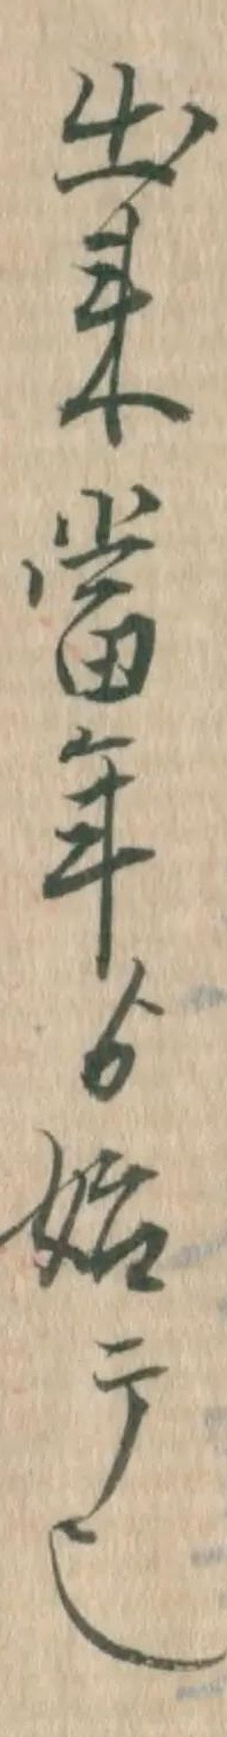出来当年ゟ始テ也
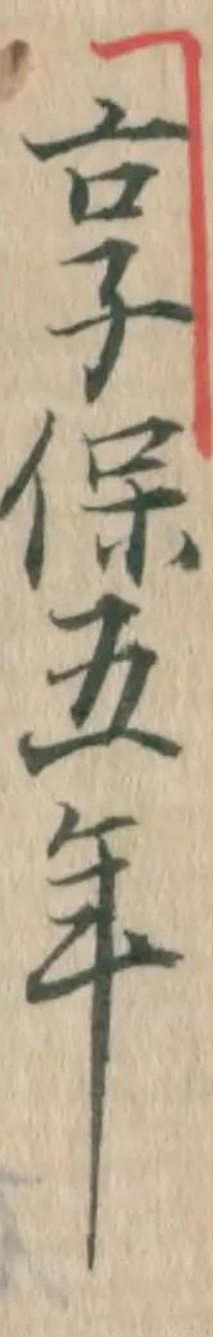享保五年
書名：賀茂社記録. 第10冊
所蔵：国立国会図書館 National Diet Library, JAPAN
